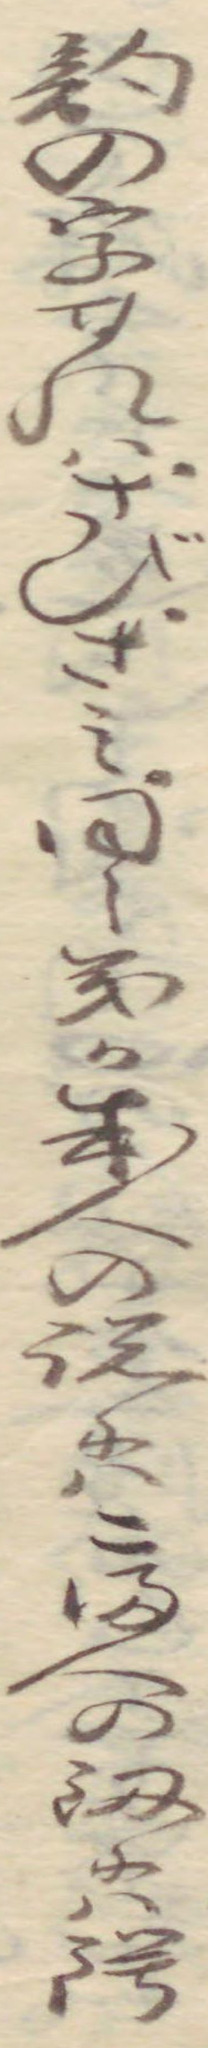韻の字なれはさびさみ同し義か或人の説にはこま人の釼には鍔
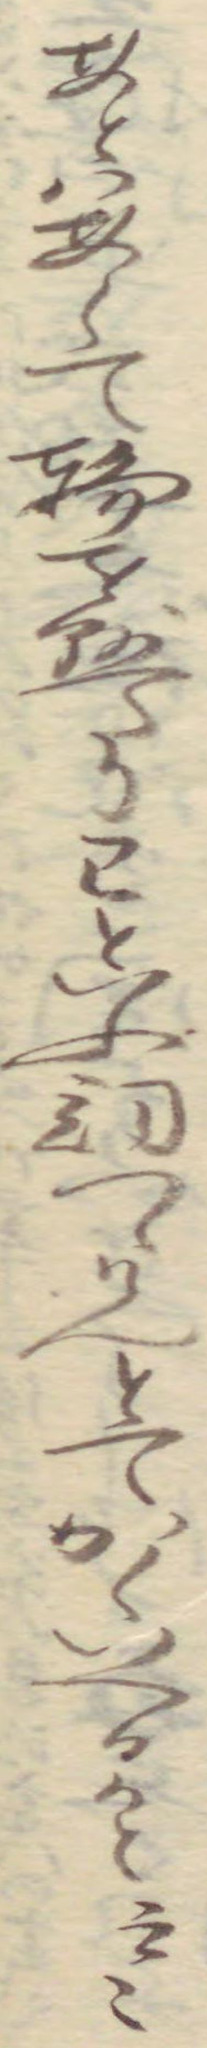なとはなくて輪を懸たりわといふ詞つゝけんとてかくいへるかと云〻
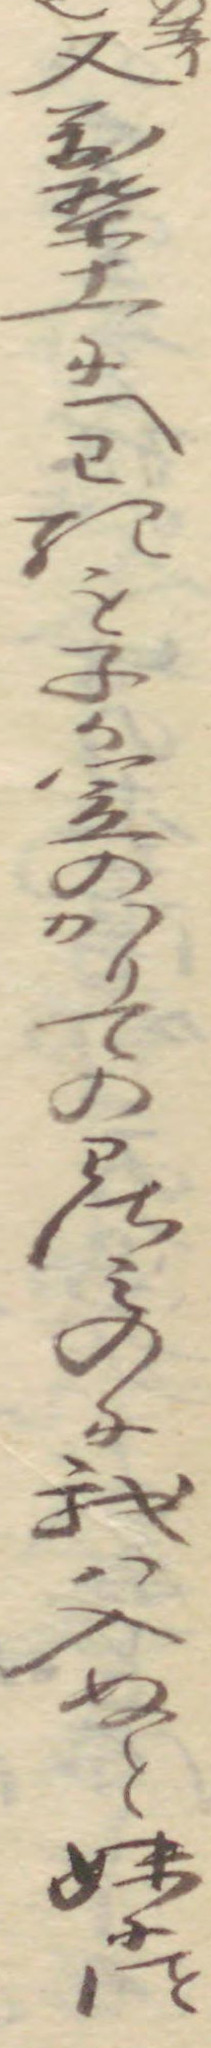又万葉十一に〽わきも子か笠のかりてのわさみのに我は入ぬと妹につ
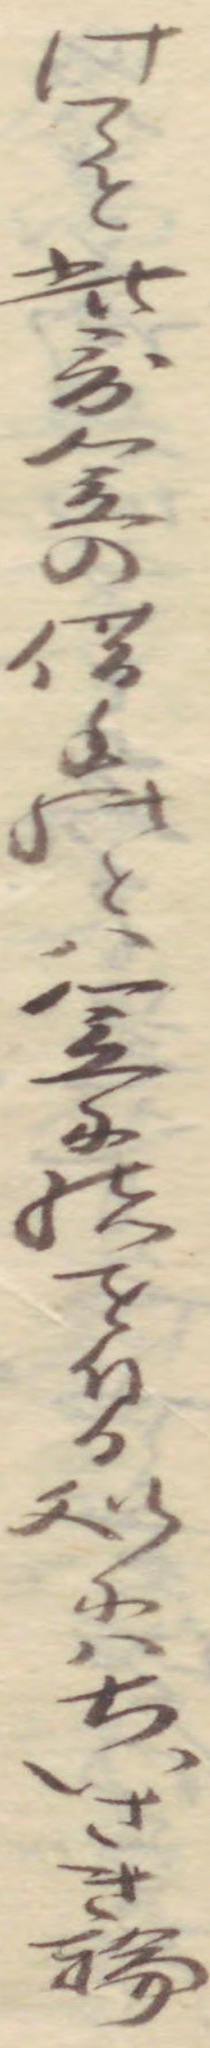けこそ此歌笠の借手のとは笠に緒を付る処にはちいさき輪
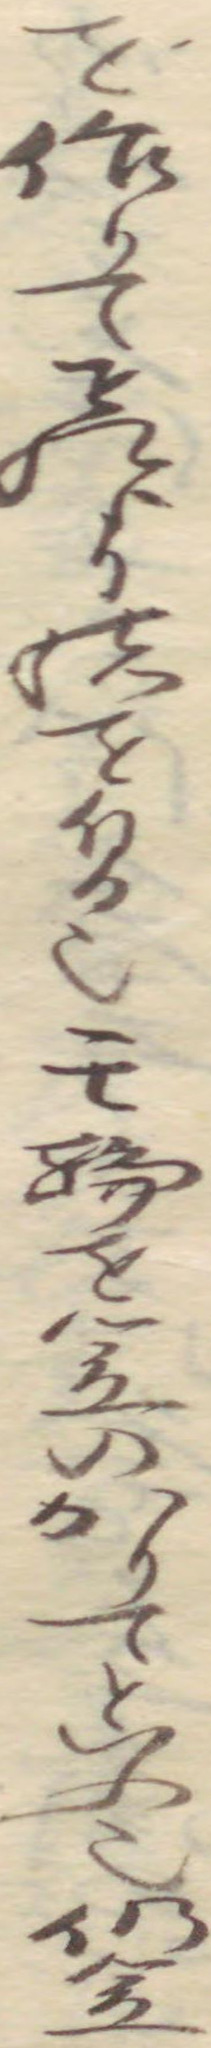を作りてそれより緒を付る也其輪を笠のかりてといふ也仍笠
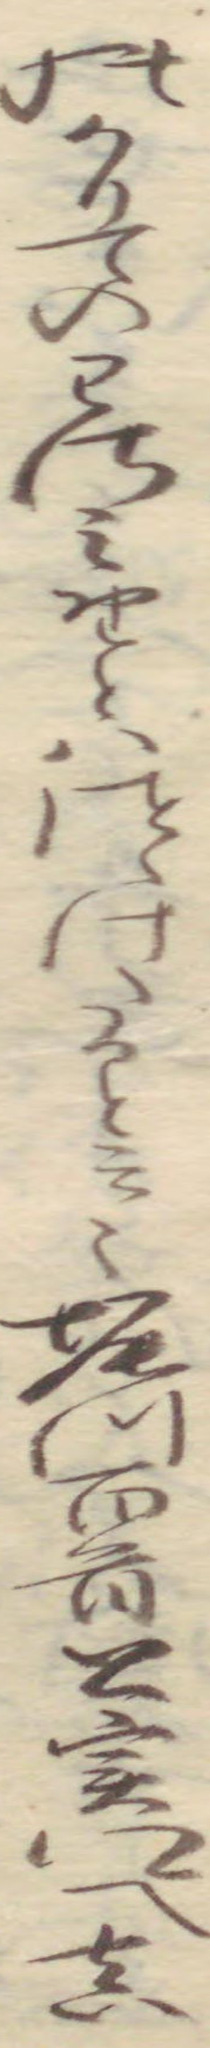のかりてのわさみのとはつゝけたると云〻堀川百首公実卿〽真
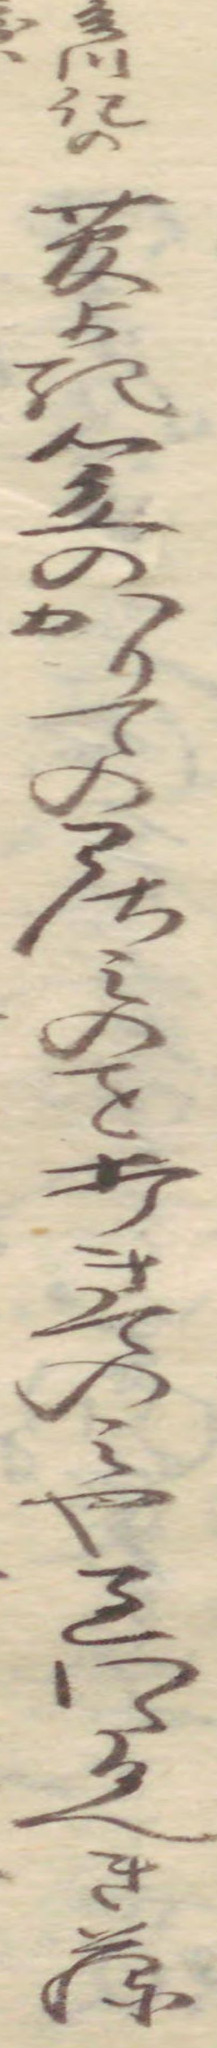菅よき笠のかりてのわさみのを打きてのみや過わたるへき藤
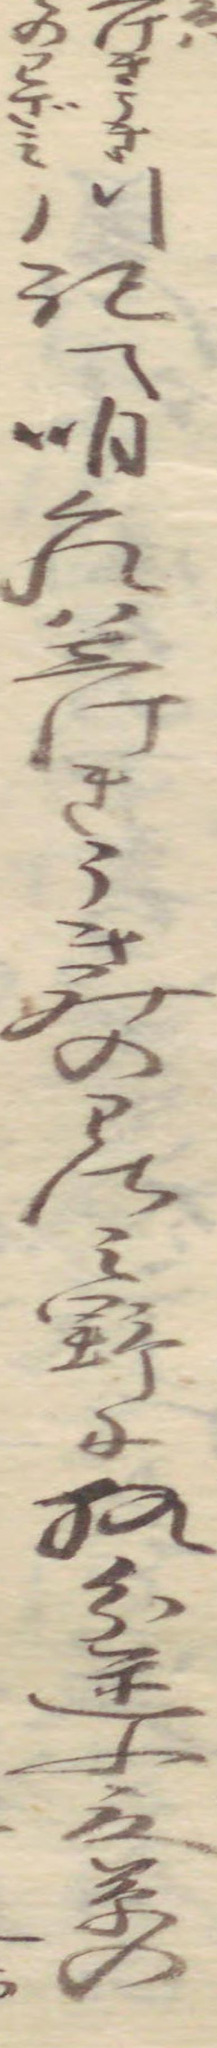川記〽明くれはしけきうきみのわさみ野に猶分迷ふ夏草の
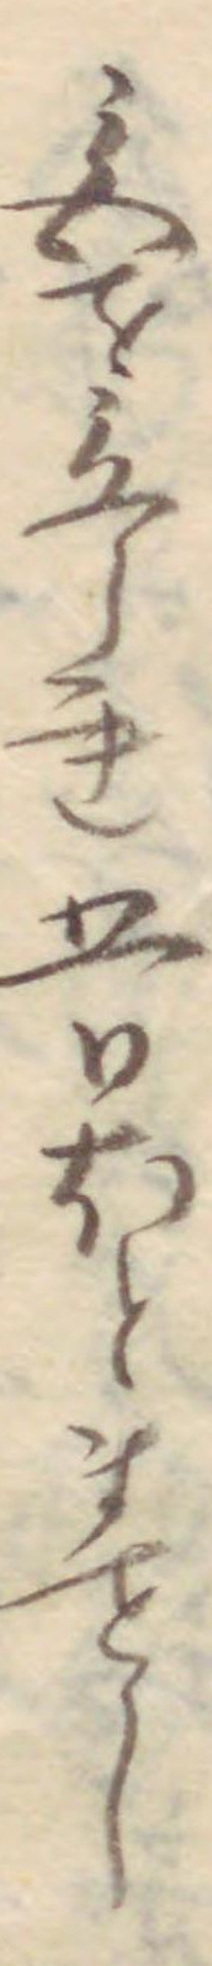宮を立られ五日ほとませし
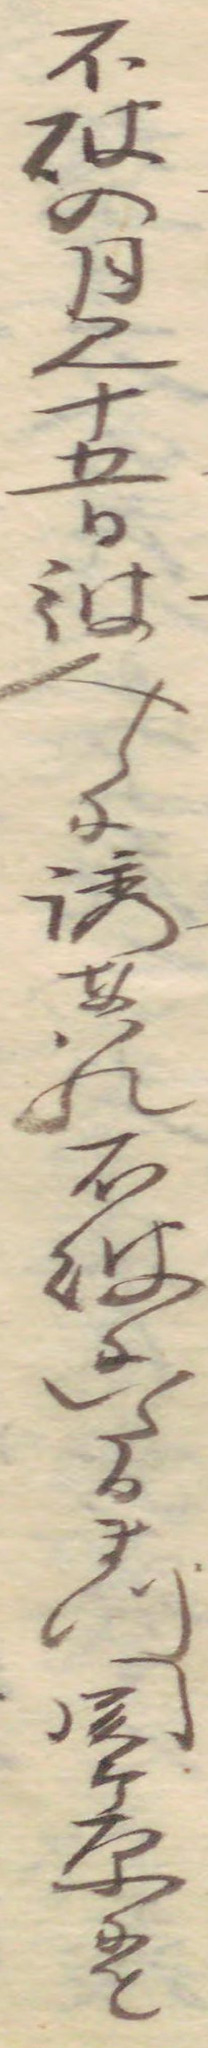不破の月見十五日彼人〳〵に誘なはれ不破にいたるまづ関ヶ原にそ
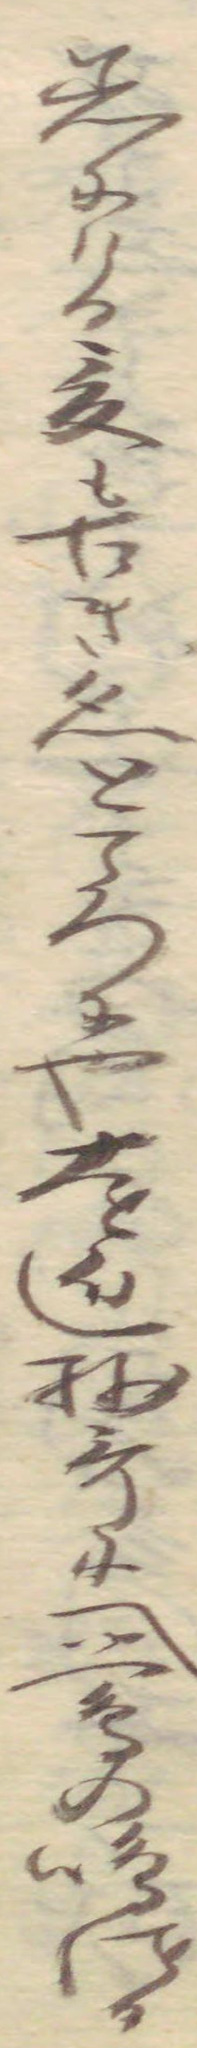着にける爰も古き名ところにや遠近抄歌に〽鶯の鳴つる

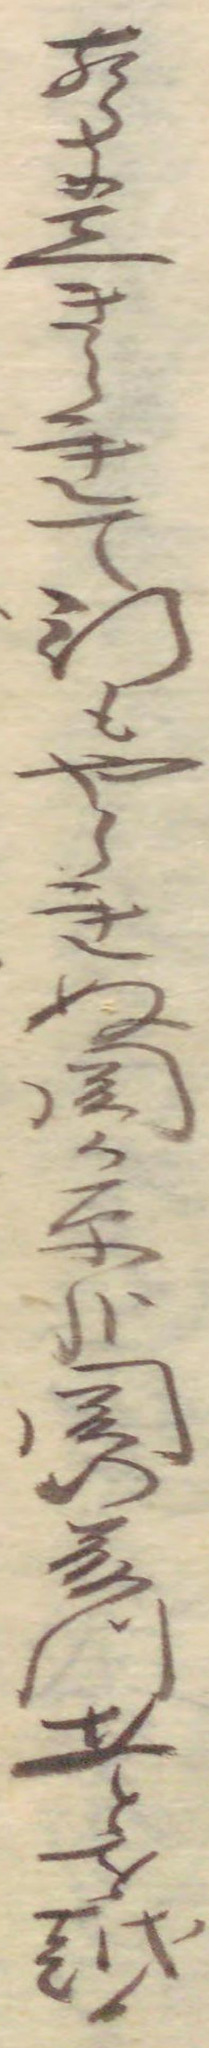聲にしきられて行もやられぬ関ヶ原哉関の藤川あとを越る
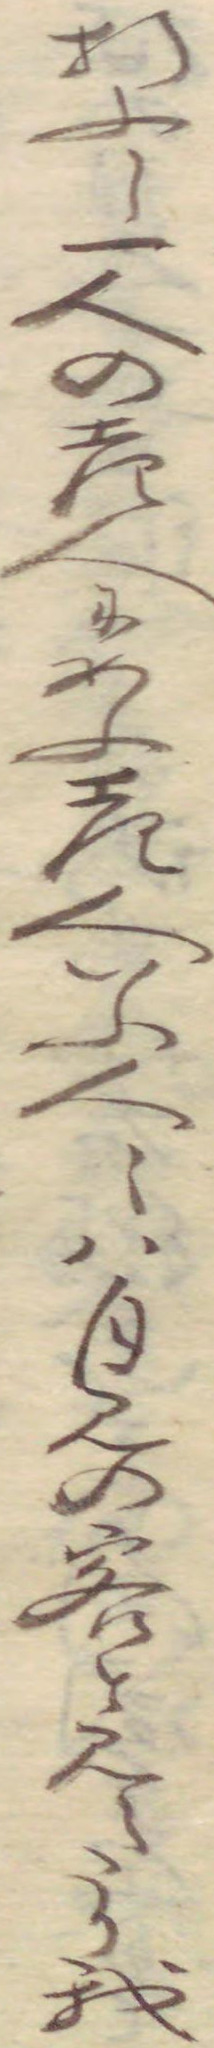折ふし一人の老人にあふ老人いふ人〻は月見の客と見えたり我
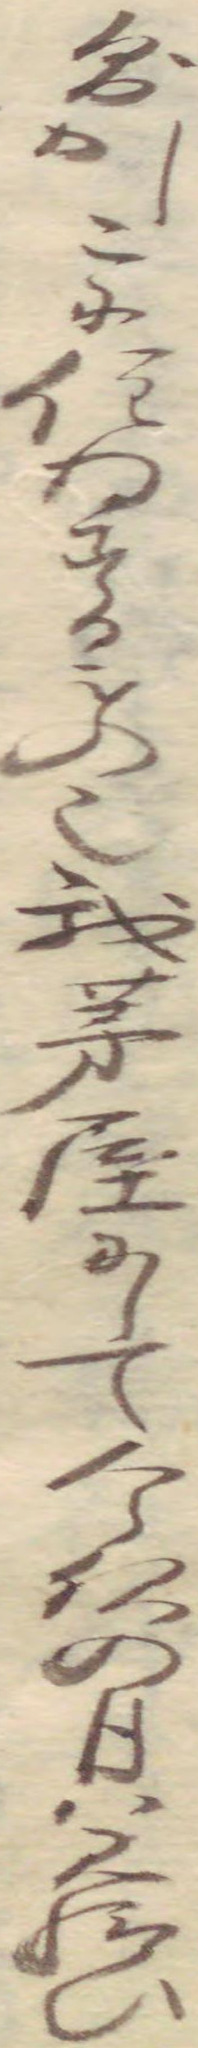則かしこに住ゐたるもの也我茅屋にして今夜の月は見給ひ
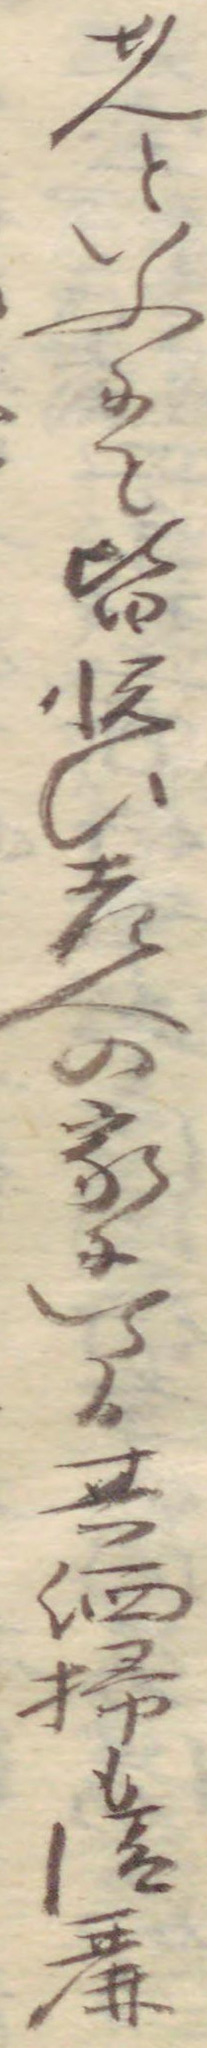なんといふにそ皆悦ひ老人の家にいたる其洒掃も清廉
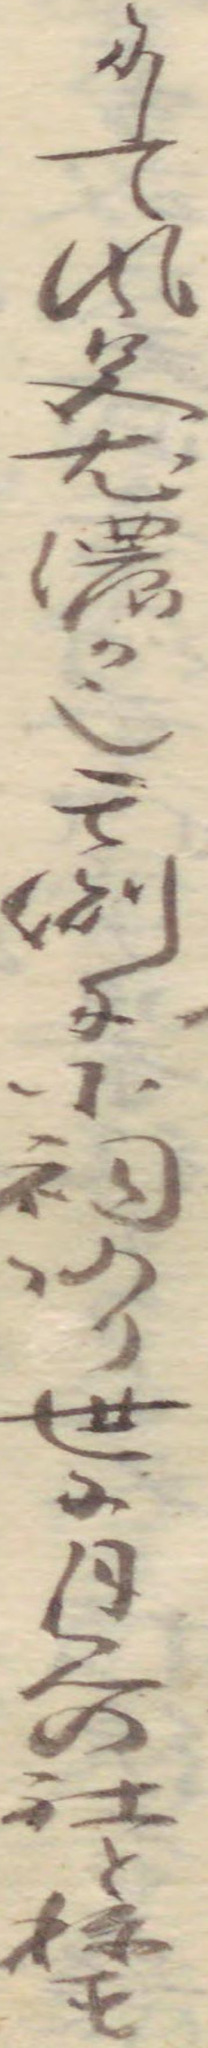にして風色尤濃か也其側に小洞あり世に月見の社と称す
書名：鶯宿雑記. 巻263-264
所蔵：国立国会図書館 National Diet Library, JAPAN
